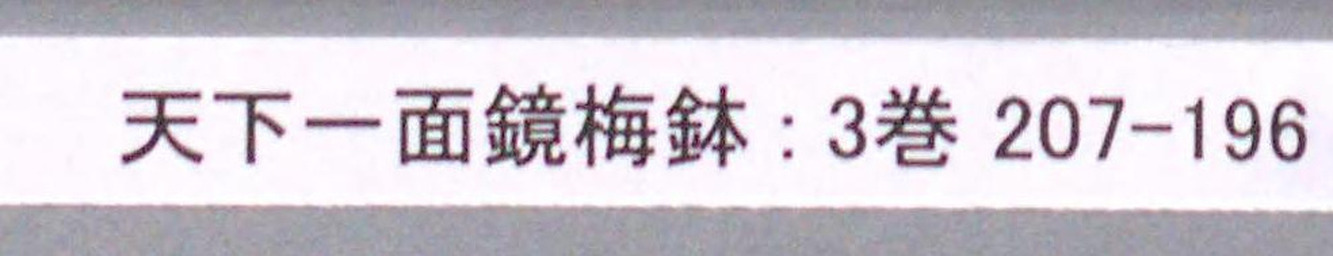天下一面鏡梅鉢全
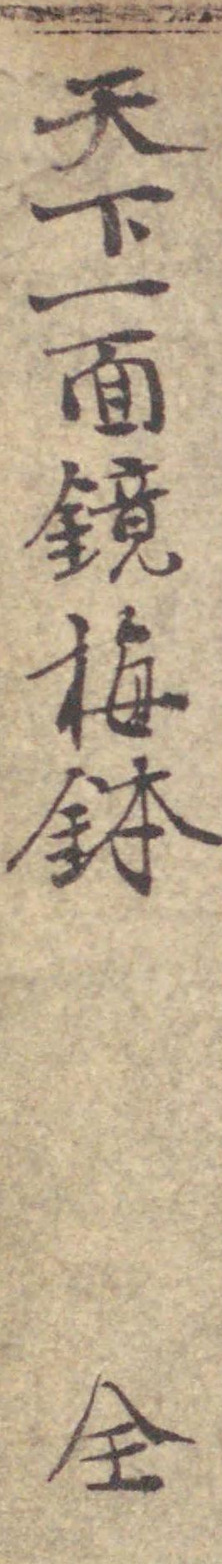天下一面鏡梅鉢全

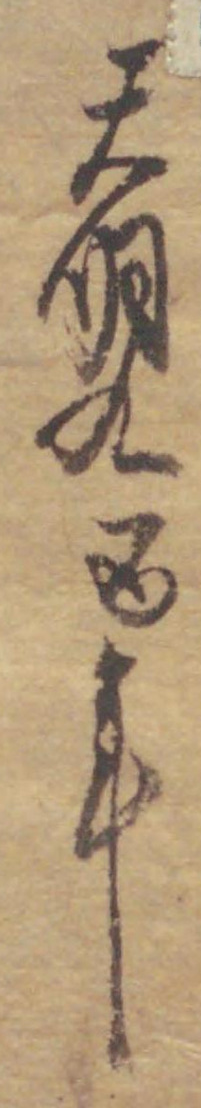天明九酉年
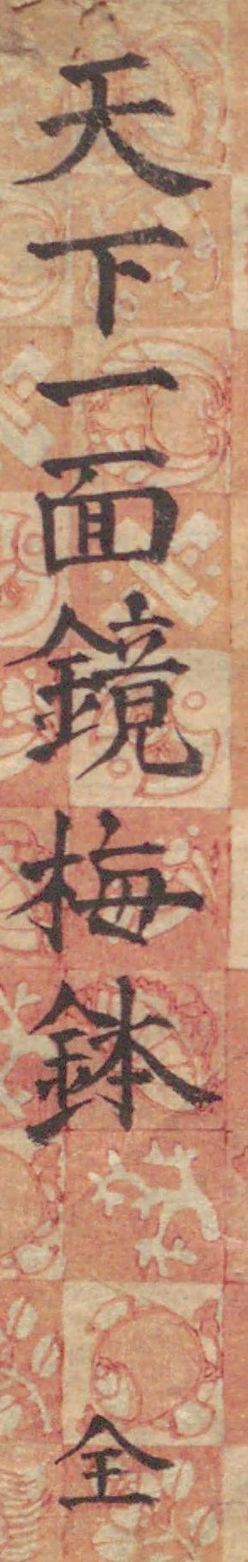天下一面鏡梅鉢全

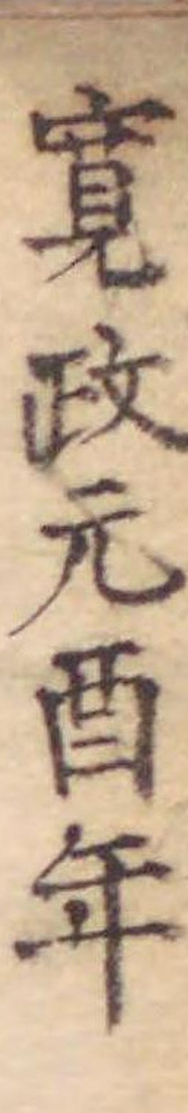寛政元酉年
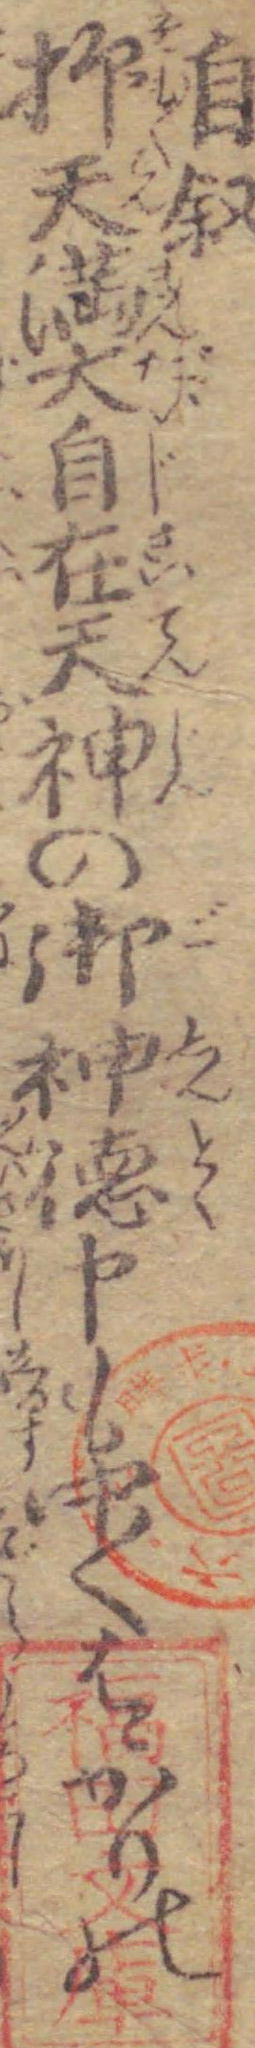抑天満大自在天の御神徳申も中〴〵はゝかりの
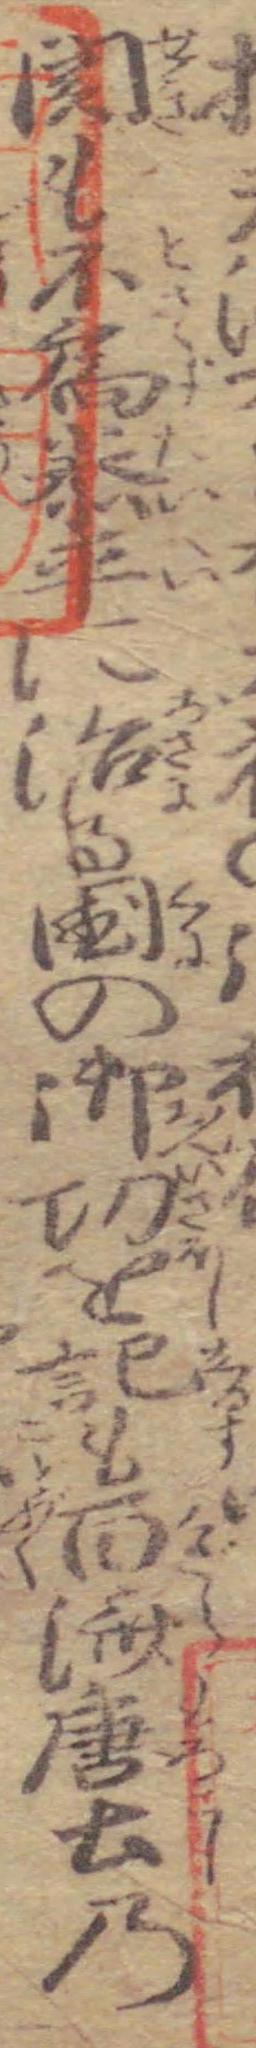関も不戸向泰平に治る国の御功を記も百済唐土の
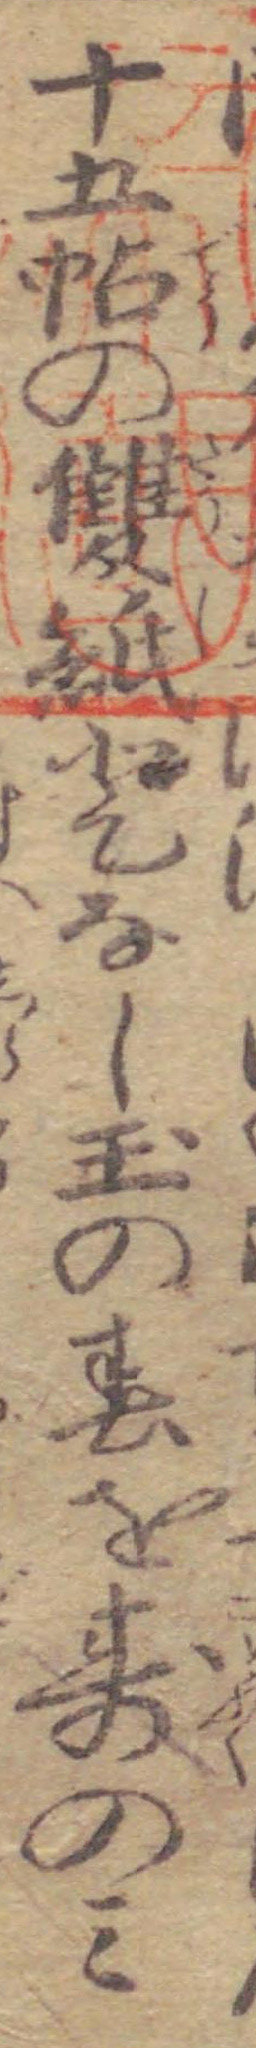十五帖の双紙となし玉の春を寿のみ
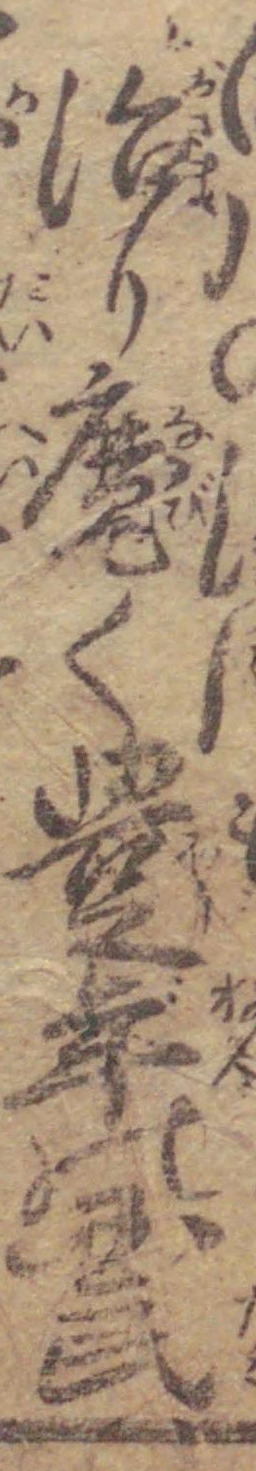治り靡く豊年の国民
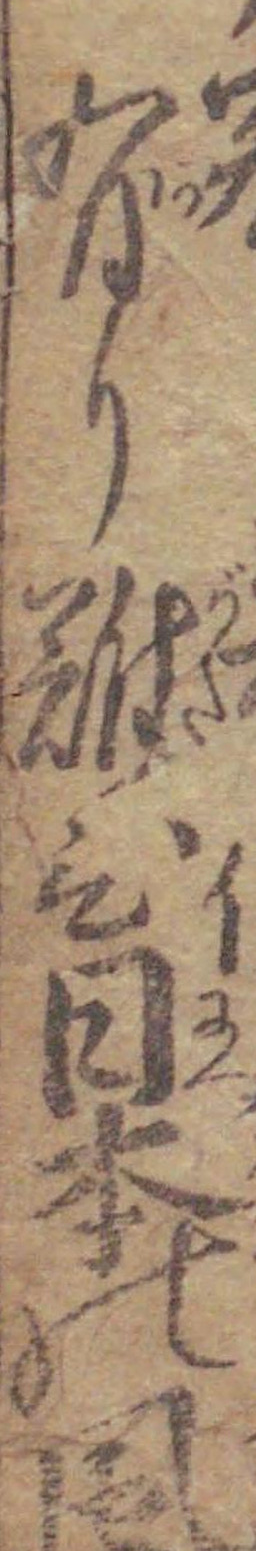有り難ひ日本の風俗

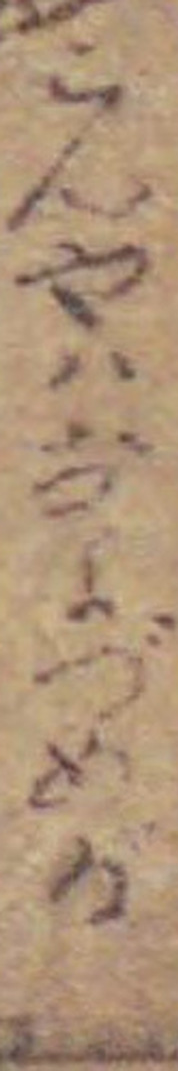こんやはおよづめが
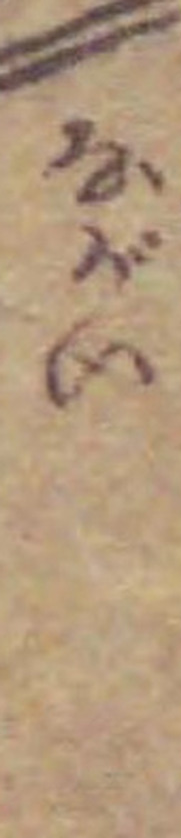ながい
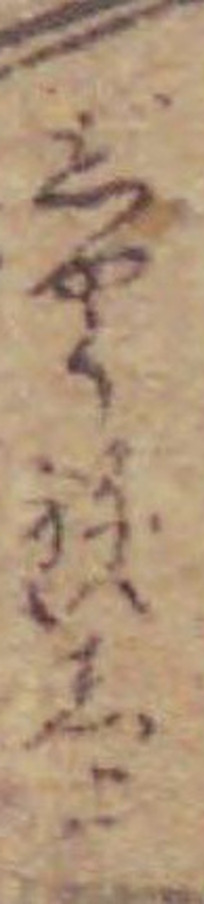じやうねいしよ
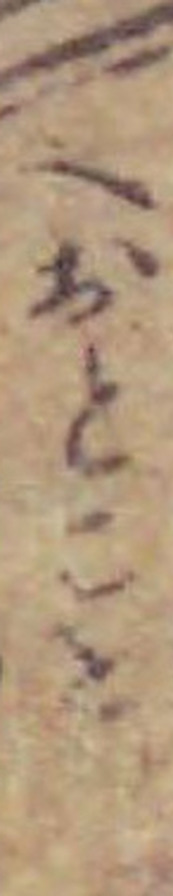へおとこを
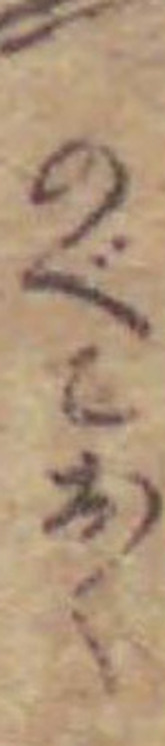のべておく
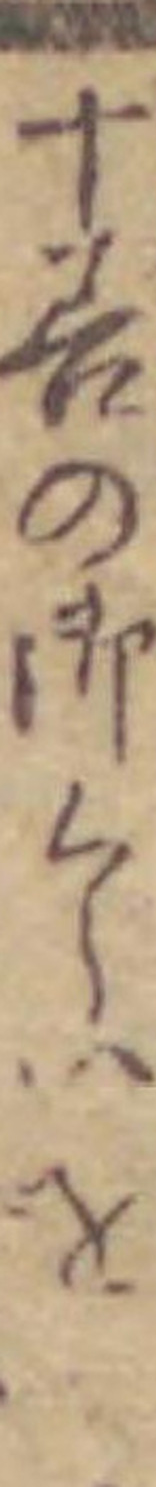十善の御くらいを
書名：天下一面鏡梅鉢 : 3巻
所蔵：国立国会図書館 National Diet Library, JAPAN
